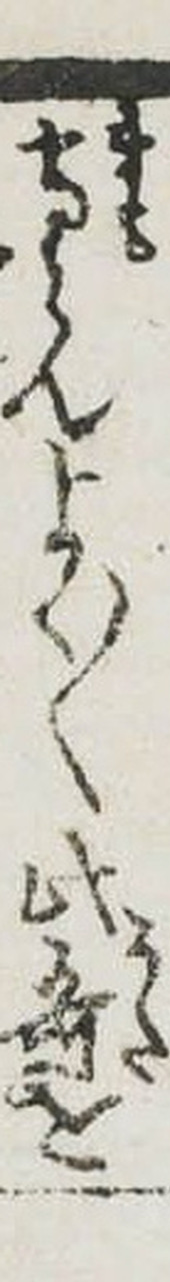守らんよく〳〵此歌を
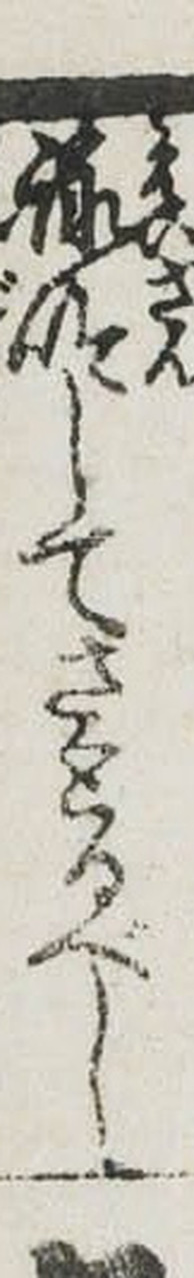詠吟してさとるべし
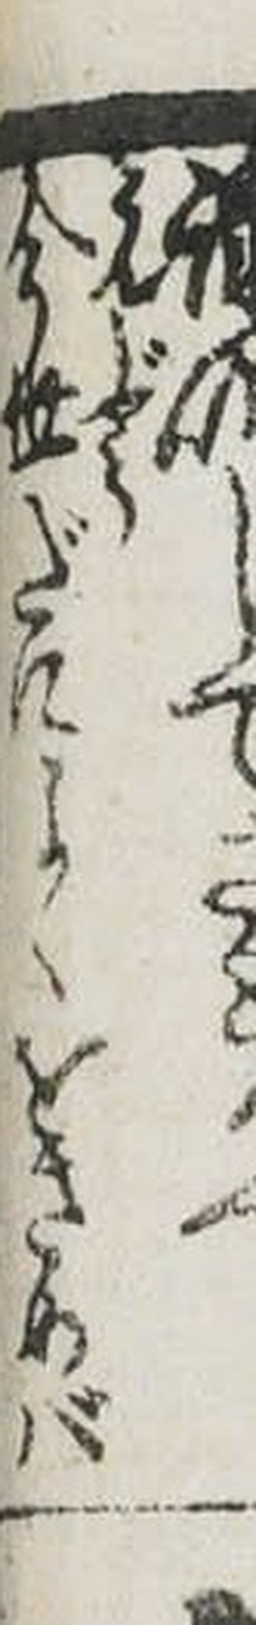今世だによくをきめば
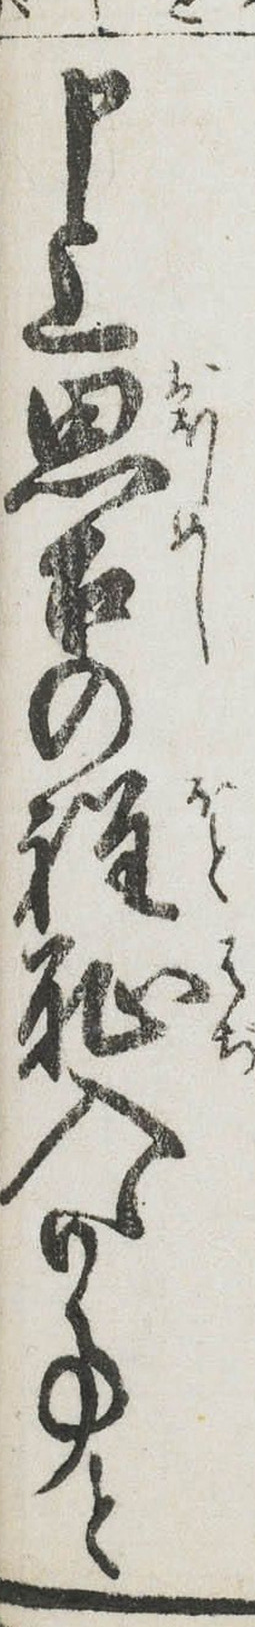申上思召の程恥入候御事と
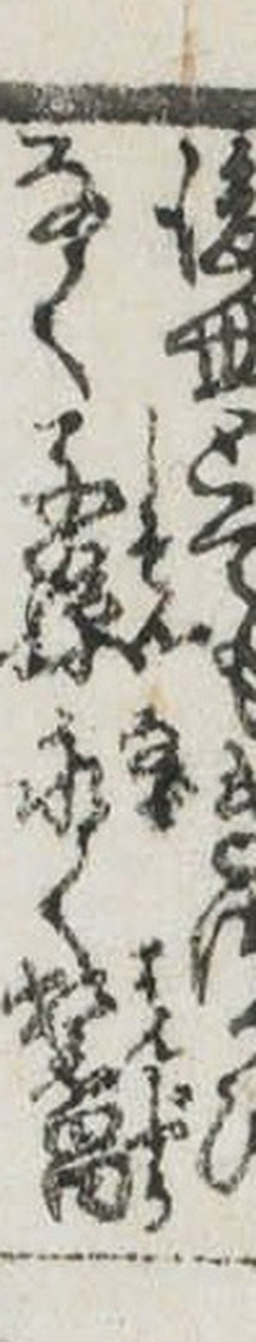なく子孫永く繁昌
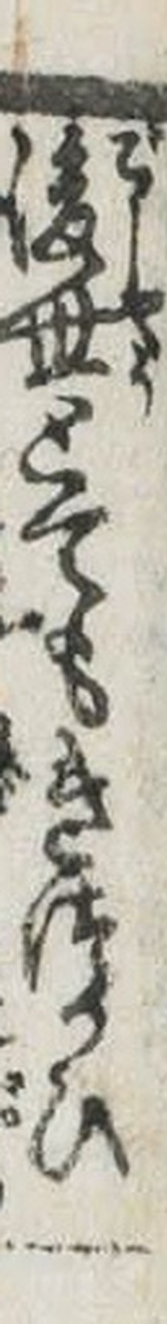後世とてもひつかひ
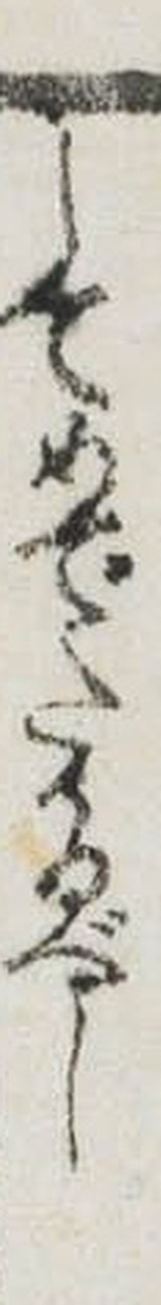してめでたけるべし
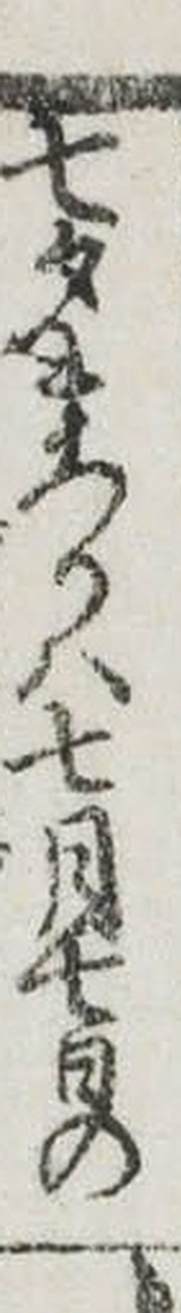七夕まつりは七月七日の
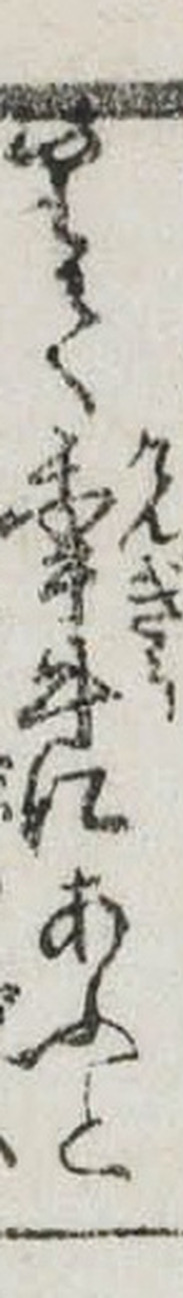りて牽牛にあふと
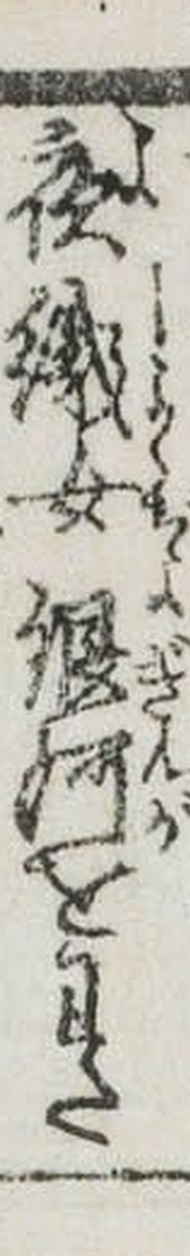夜織女銀河をわた
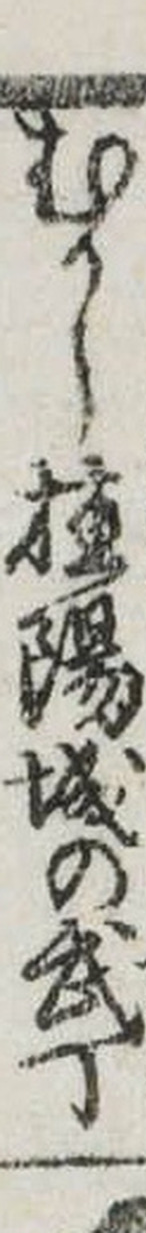むかし桂陽城の武丁
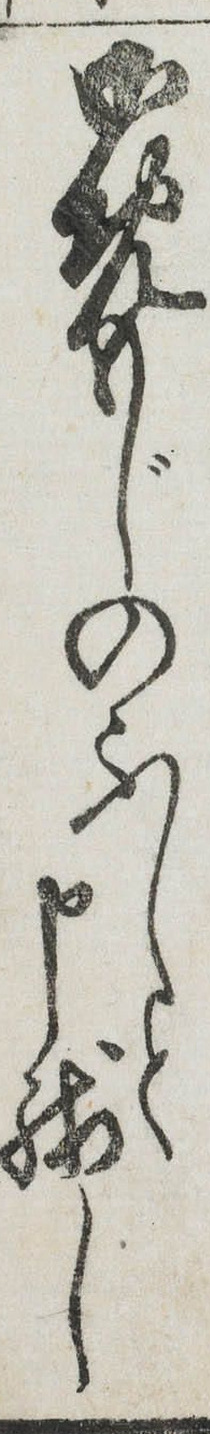御めもじのふしと申残し
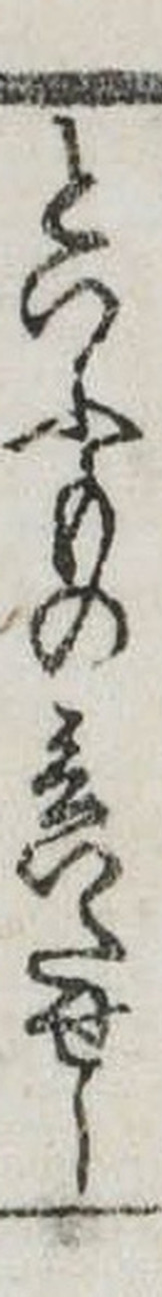といふもの言いたせし
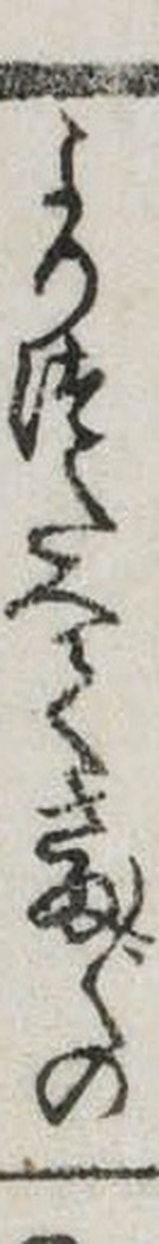よりつたへてさま〴〵の
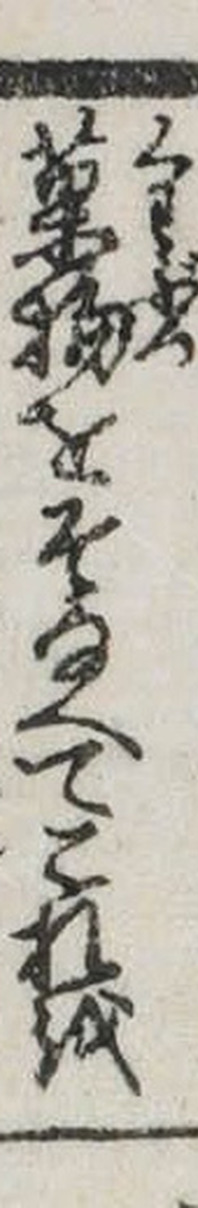菓物をそなへてこれを
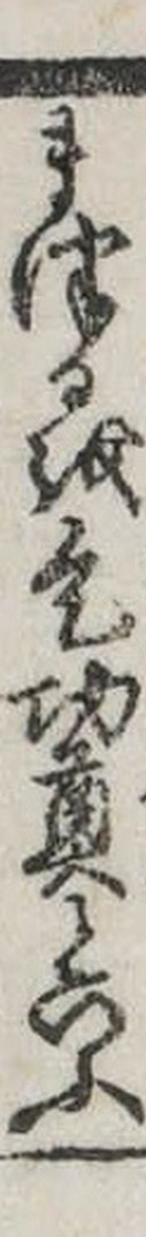まつるを乞功奠といふ
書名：頭書萬用婦人手紙之文言
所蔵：東京学芸大学教育コンテンツアーカイブ
